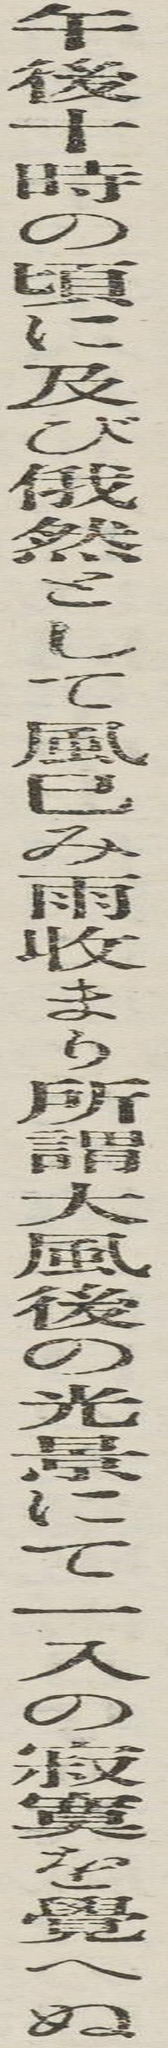午後十時の頃に及び俄然として風已み雨収まり所謂大風後の光景にて一入の寂寞を覚へぬ
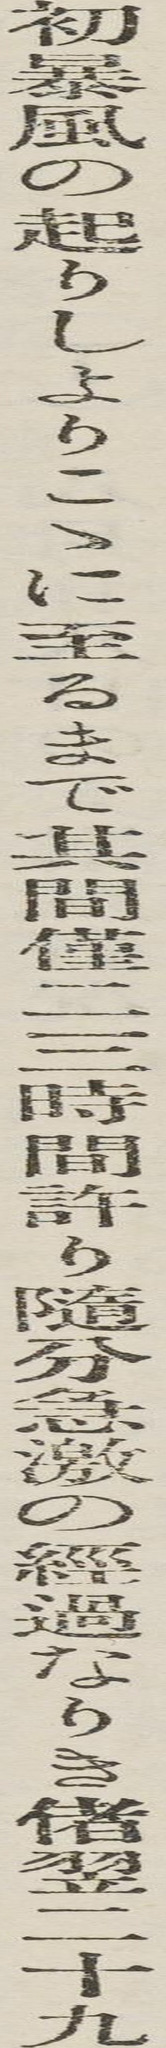初防風の起りしよりこゝに至るまで其間僅二三時間許り随分急激の経過なりき偖翌二十九
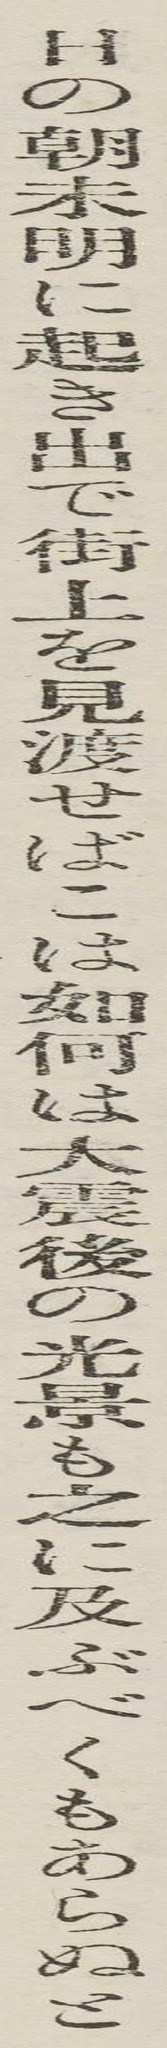日の朝未明に起き出で街上を見渡せばこは如何は大震後の光景も之に及ぶべくもあらぬと
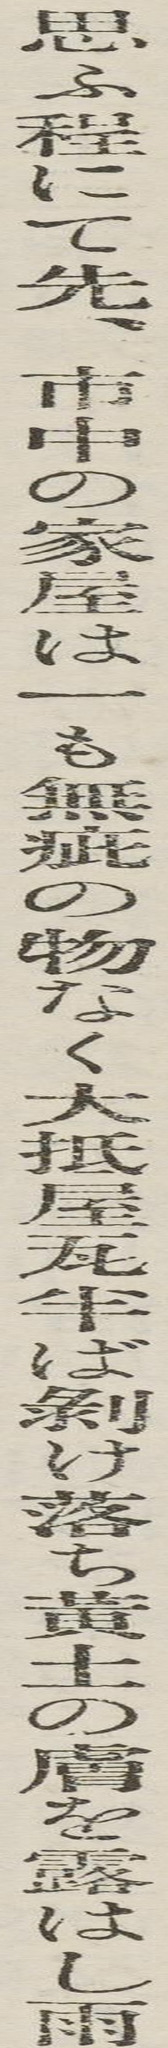思ふ程にて先、市中の家屋は一も無疵の物なく大抵屋瓦半ば剥け落ち黄土の膚を露はし雨
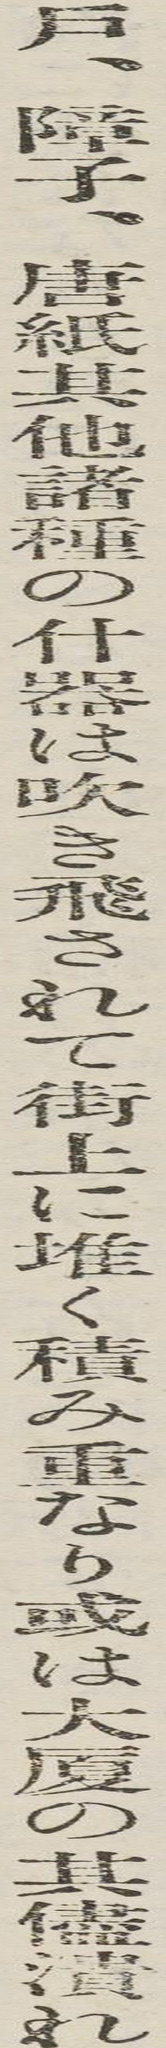戸、障子、唐紙其他諸種の什器は吹き飛されて街上に堆く積み重なり或は大厦の其儘潰れ
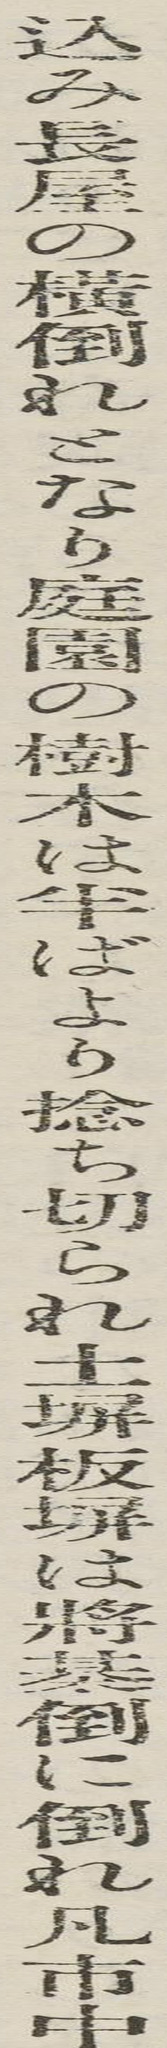込み長屋の横倒れとなり庭園の樹木は半ばより捻ち切られ土塀板塀は将棋倒に倒れ凡市中
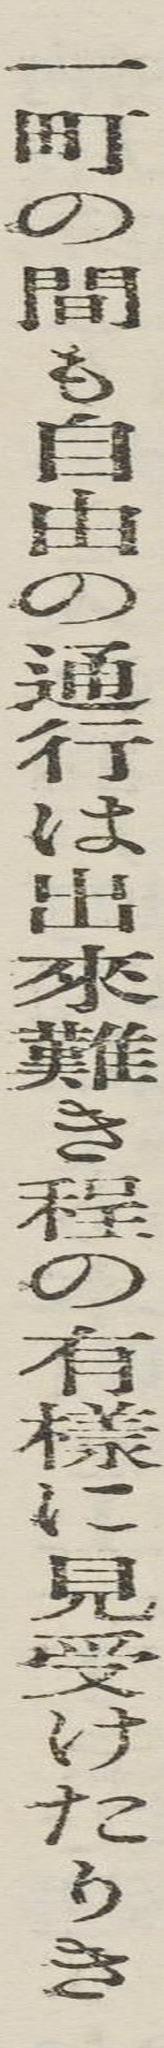一町の間も自由の通行は出来難き程の有様に見受けたりき
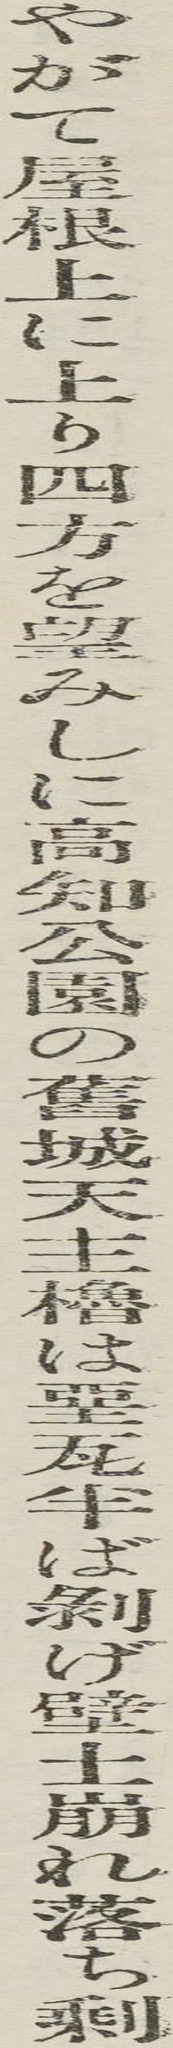やがて屋根上に上り四方を望みしに高知公園の旧城天主櫓は堊瓦半ば剥げ壁土崩れ落ち剰
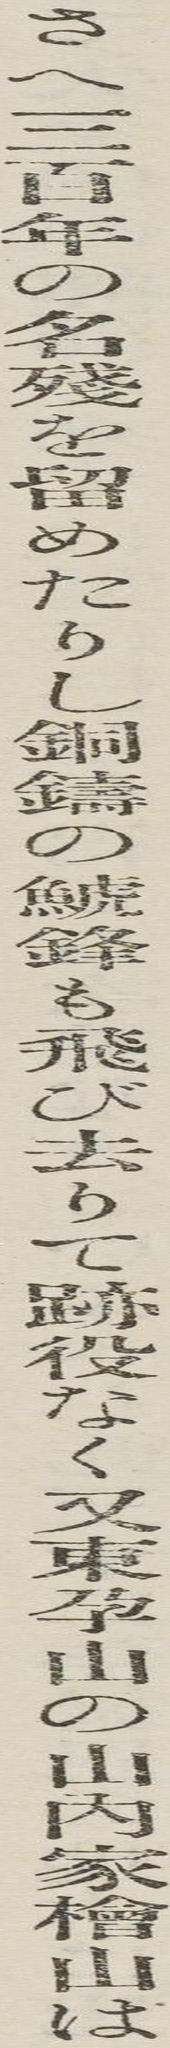さへ三百年の名残を留めたりし銅鋳の鯱鋒も飛び去りて跡役なく又東孕山の山内
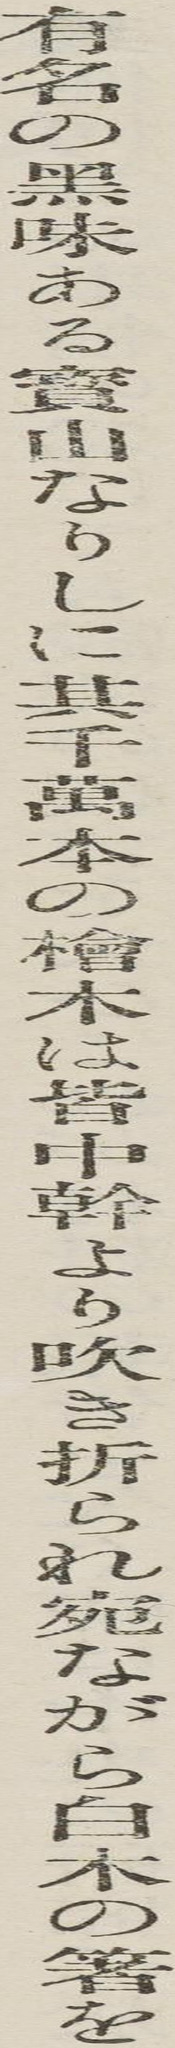有名の黒味のある宝山なりしに其千万本の桧木は皆中幹より吹き折られ宛ながら白木の箸を
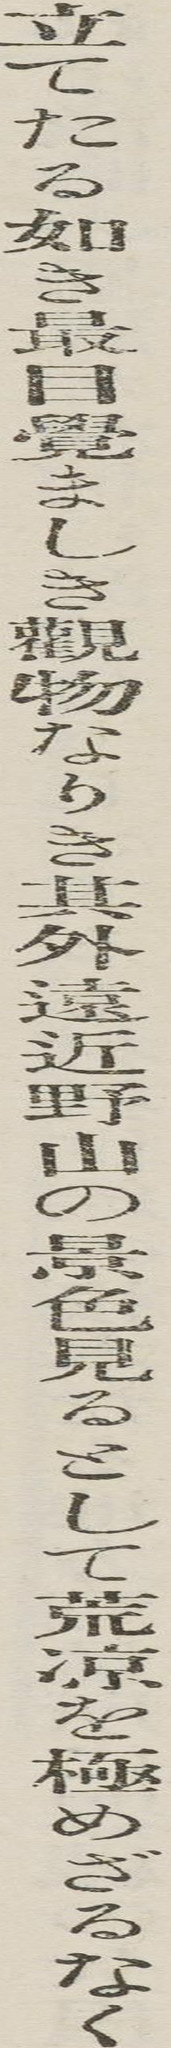立てたる如き最目覚ましき観物なりき其外遠近野山の景色見るとして荒涼を極めざるなく
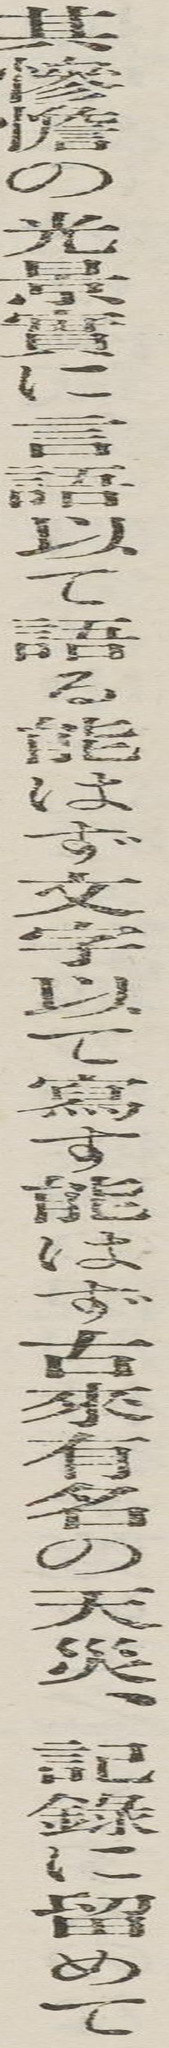其惨憺の光景実に言語以て語る能はず文字以て写す能はず古来有名の天災、記録に留めて
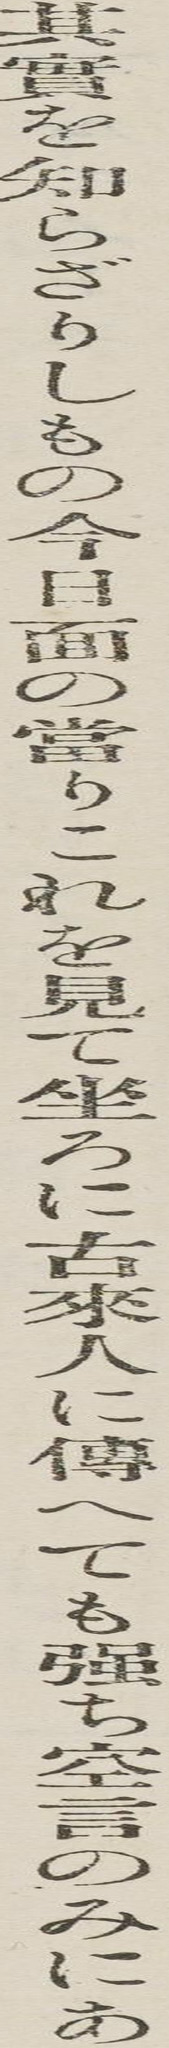其実を知らざりしもの今日面の当りこれを見て坐ろに古来人に伝えへても強ち空言のみにあ
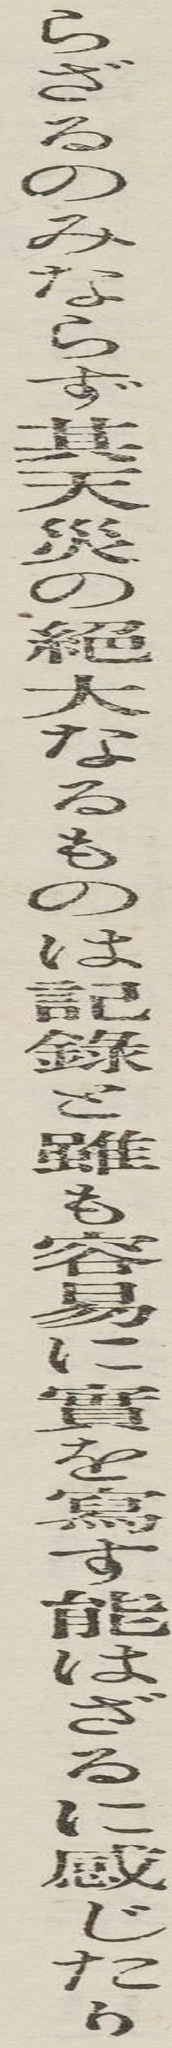らざるのみならず其天災の絶大なるものは記録と雖も容易に実を写す能はざるに感じたり
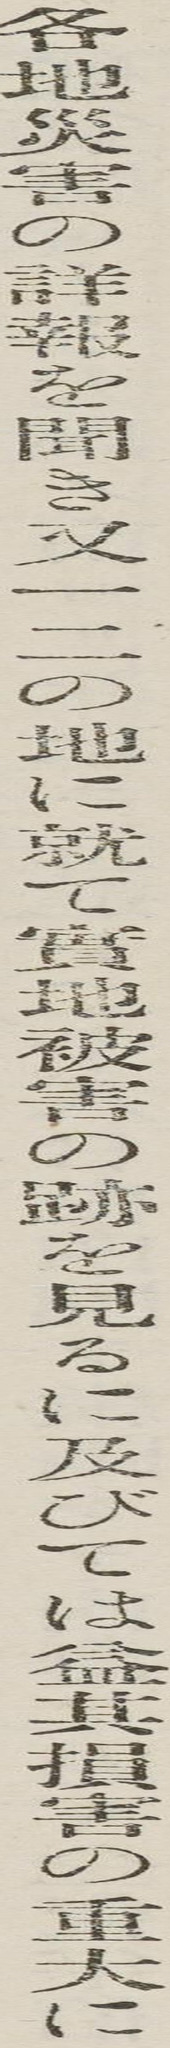各地災害の詳報を聞き又一二の地に就て実地被害の跡を見るに及びては益其損害の重大に
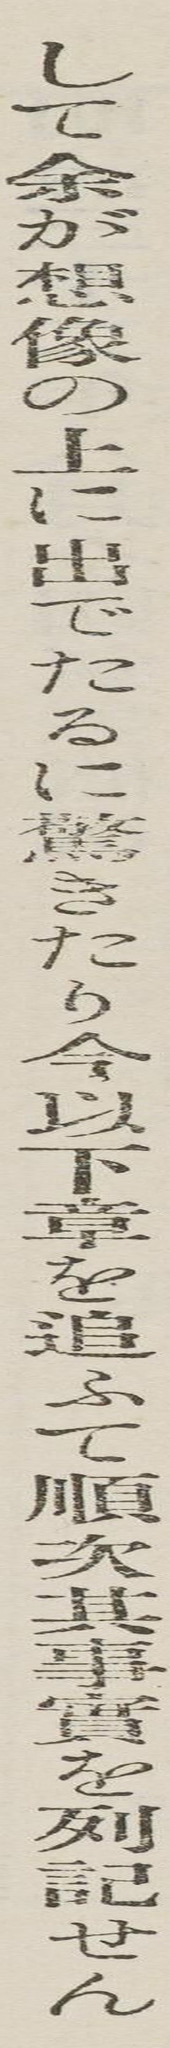して余が想像の上に出でたるに驚きたり今以下章を追ふて順次其事実を列記せん
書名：土佐古今ノ地震
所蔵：東京大学地震研究所図書室 Earthquake Research Institute Library, The University of Tokyo, JAPAN
